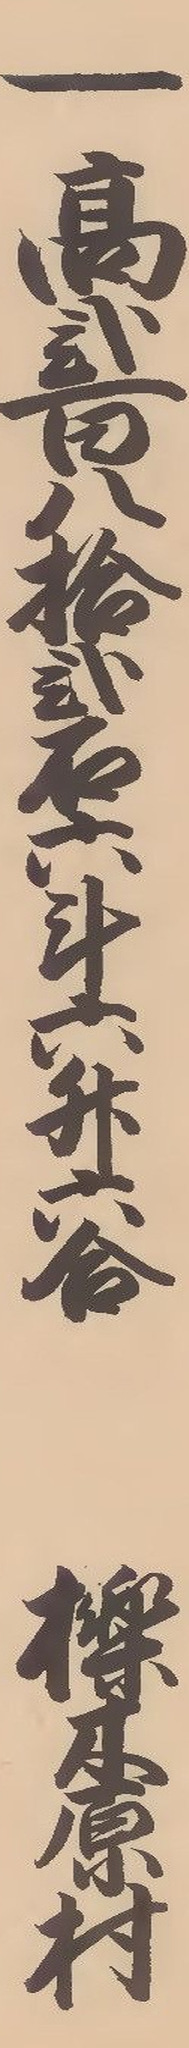一髙弐百八拾弐石六斗六升六合櫟木原村
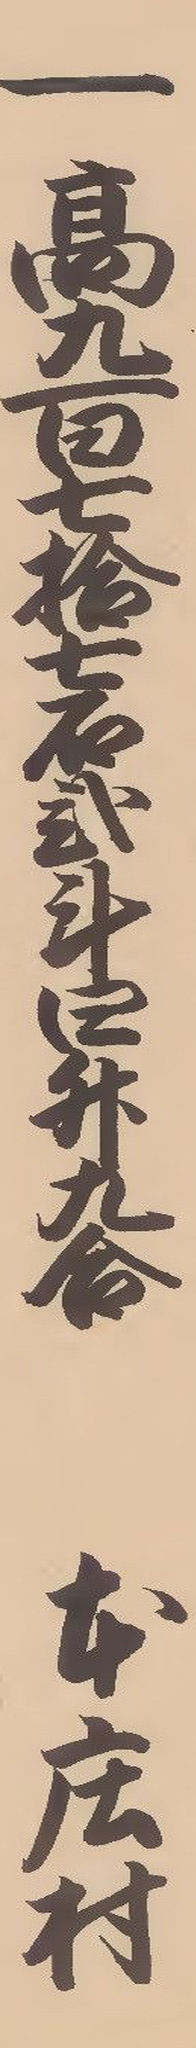一髙九百七拾七石弐斗四升九合本庄村
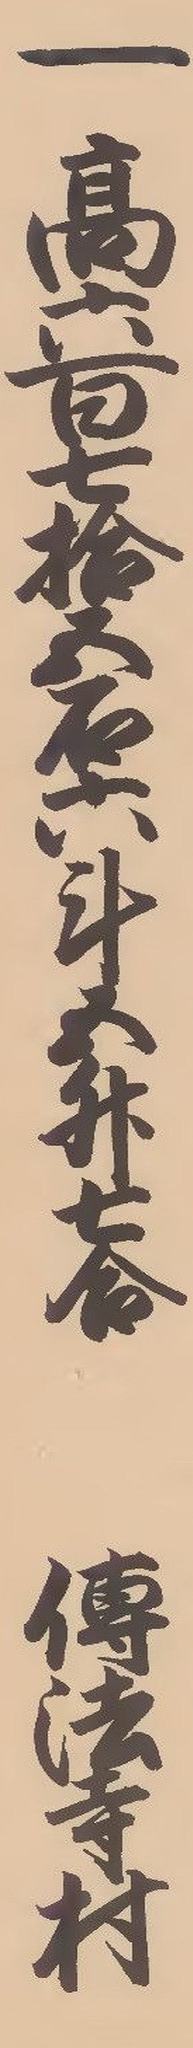一高六百七拾五石六斗五升七合傳法寺村

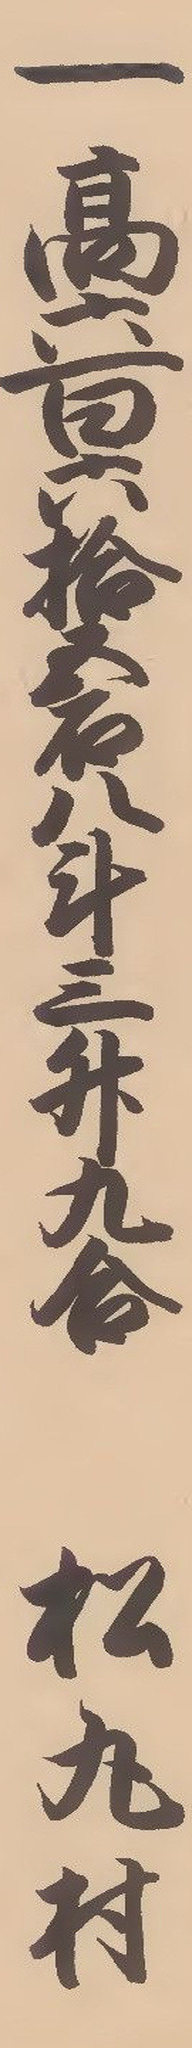一髙六百六拾五石八斗三升九合松丸村
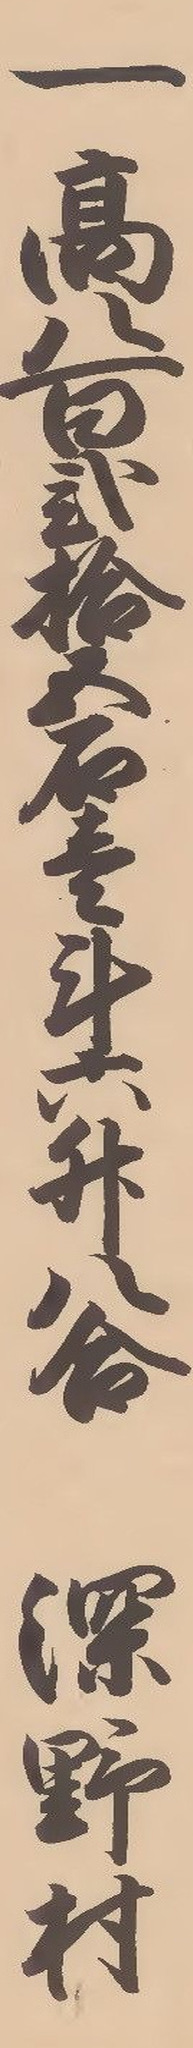一髙八百弐拾五石壱斗六升八合深野村
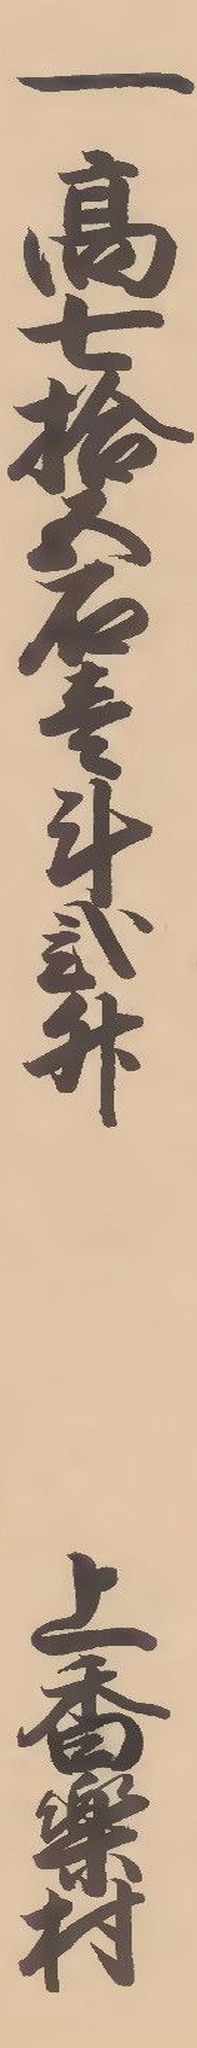一髙七拾五石壱斗弐升上香樂村
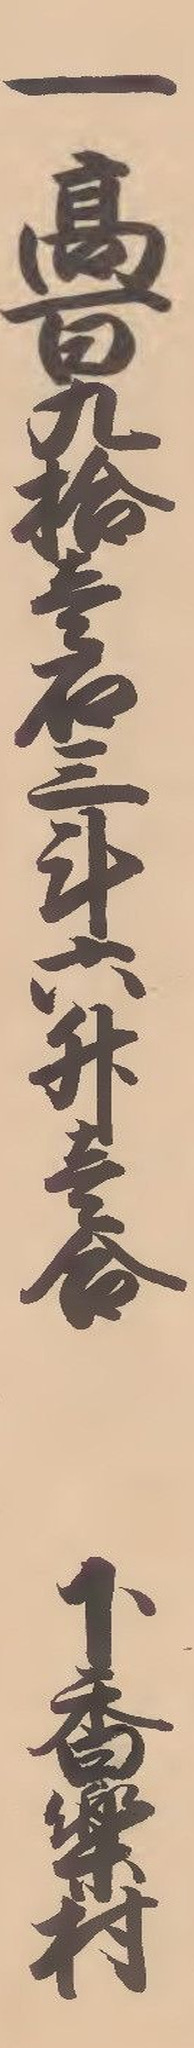一髙百九拾壱石三斗六升壱合下香樂村
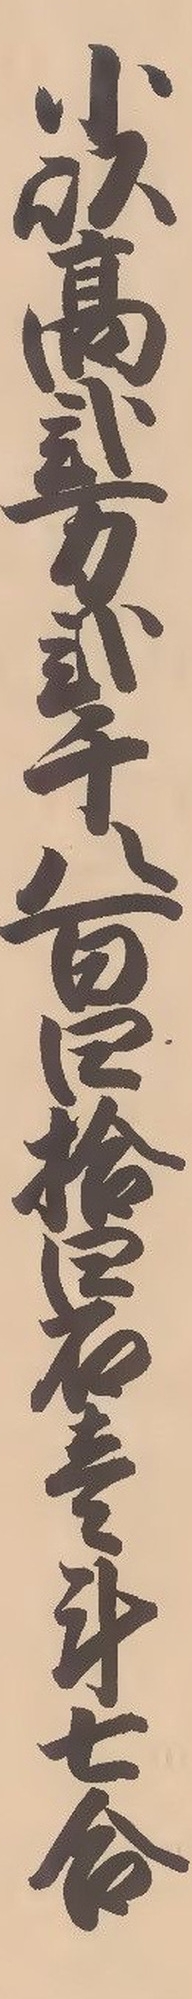小以髙弐万弐千八百四拾四石壱斗七合

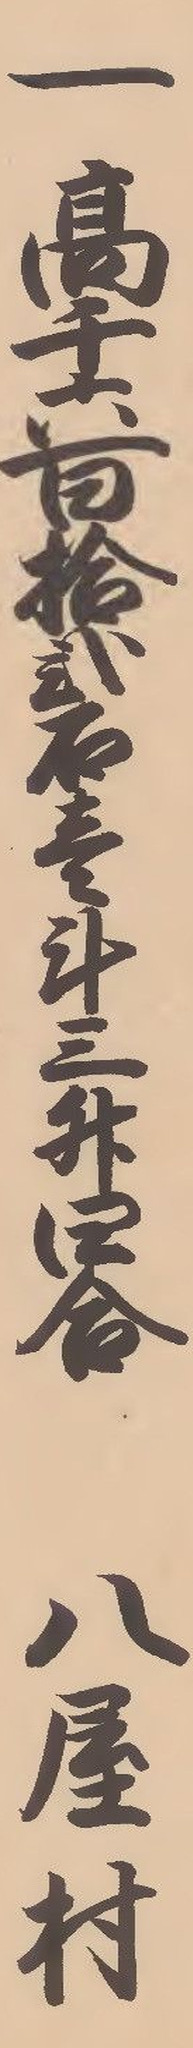一髙千六百拾弐石壱斗三升四合八屋村
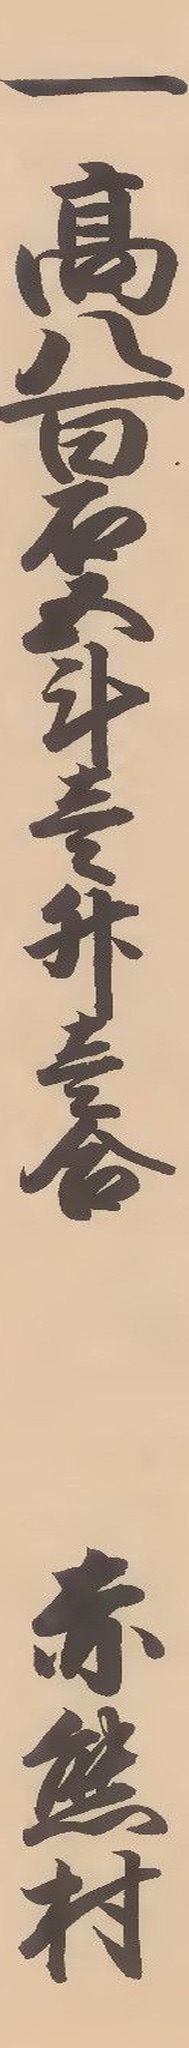一髙八百石五斗壱升壱合赤熊村
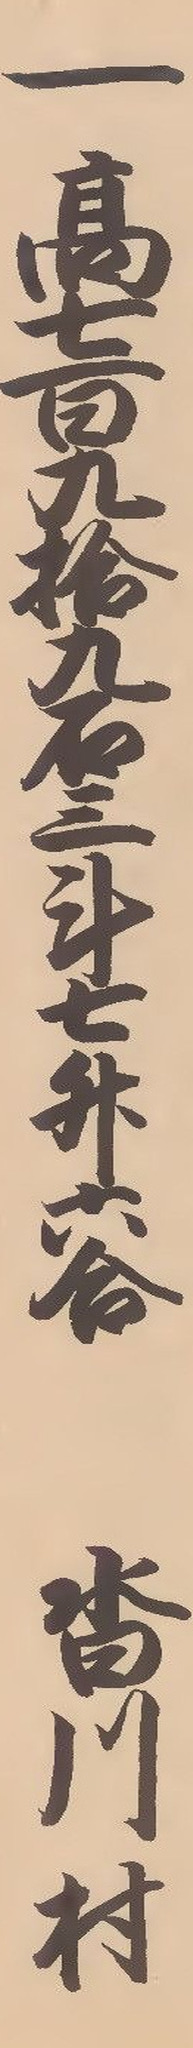一髙七百九拾九石三斗七升六合沓川村
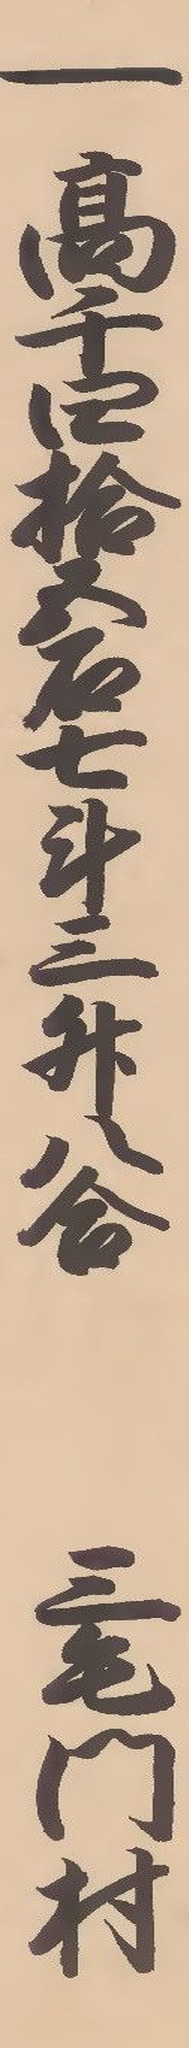一髙千四拾五石七斗三升八合三毛門村
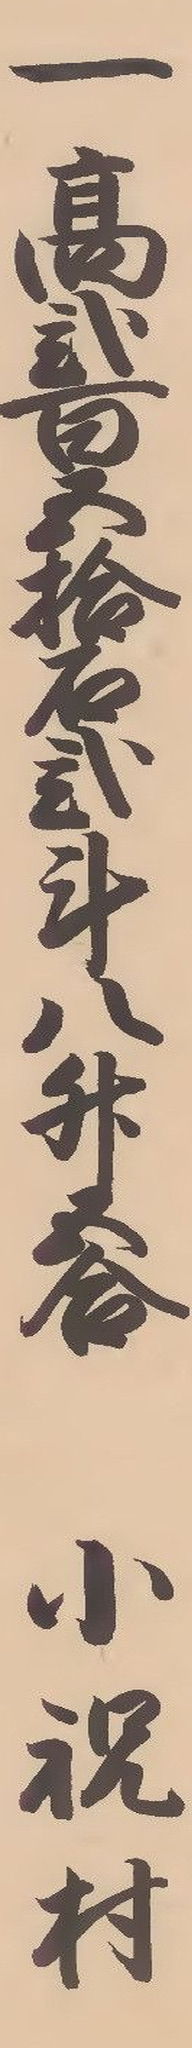一髙弐百五拾石弐斗八升五合小祝村
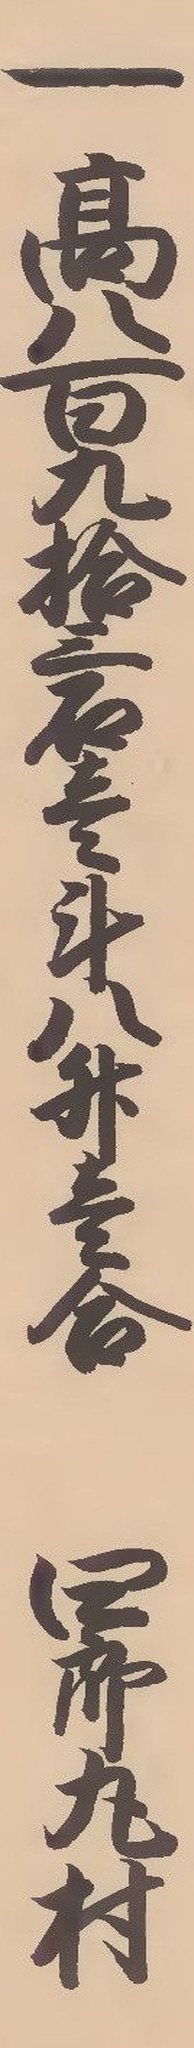一髙八百九拾三石壱斗八升壱合四郎丸村
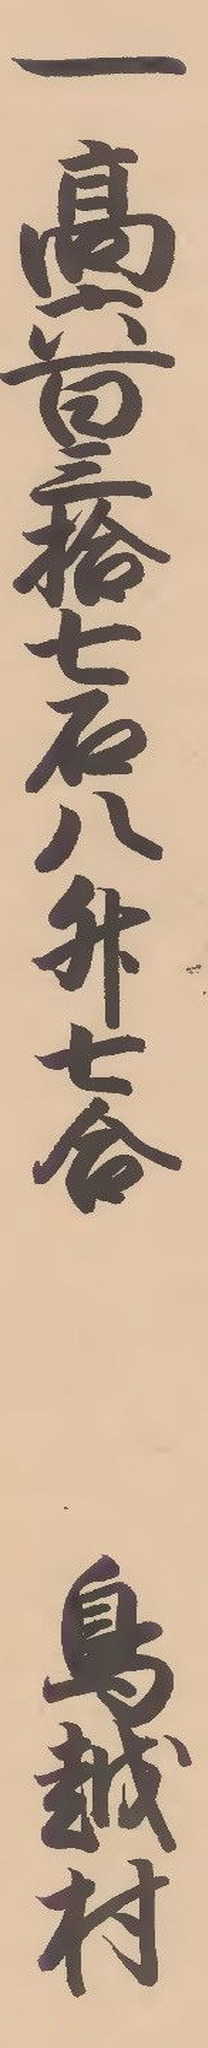一髙六百三拾七石八升七合鳥越村

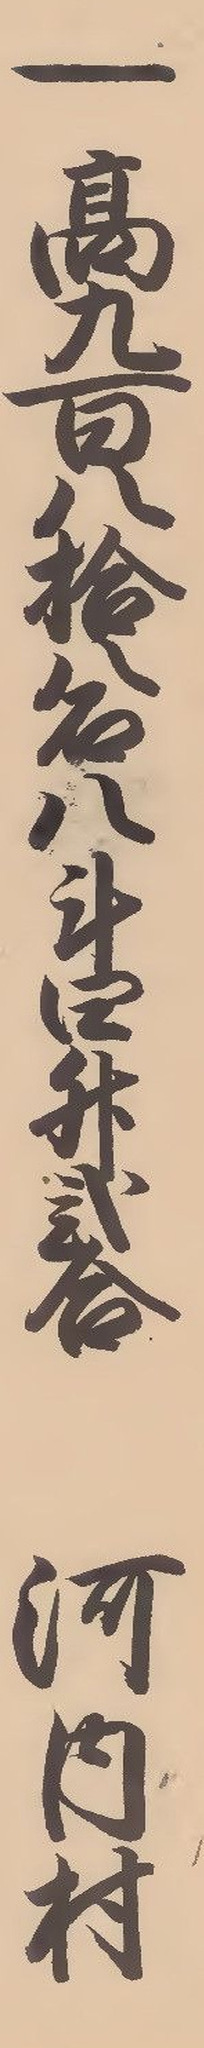一髙九百八拾八石八斗四升弐合河内村
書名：豊前国郷帳
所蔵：国立公文書館 National Archives of Japan
